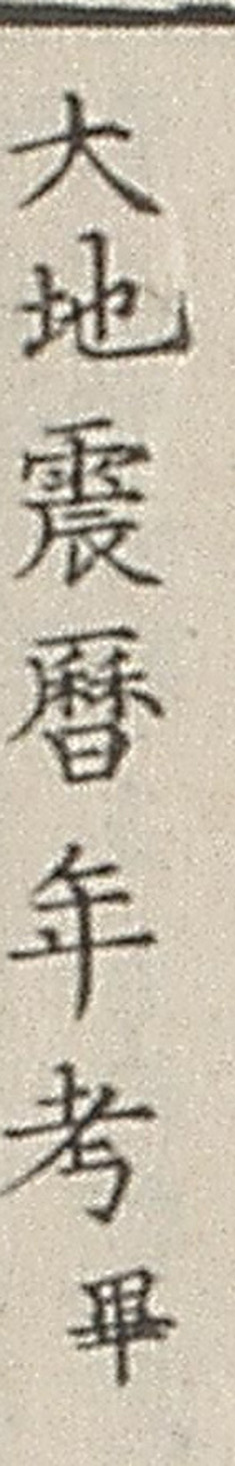大地震暦年考畢
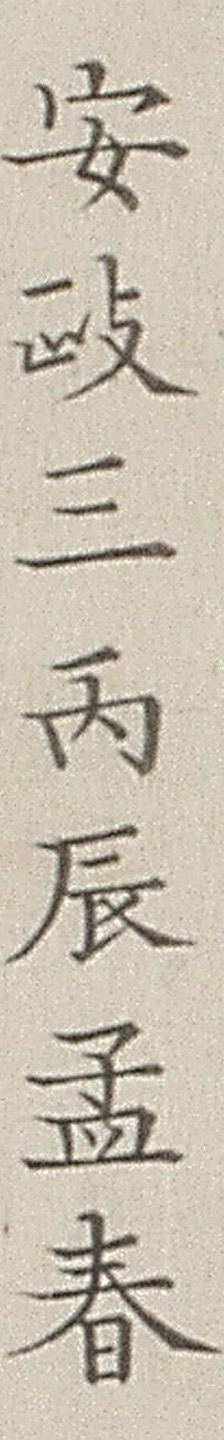安政三丙辰孟春
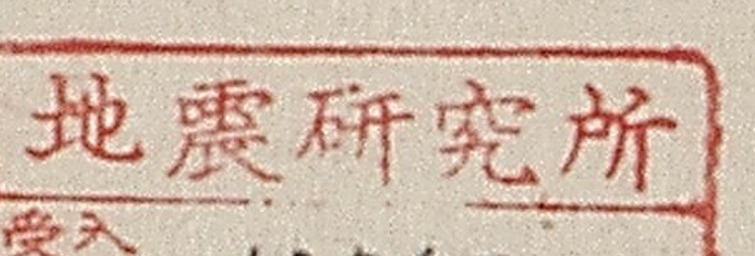地震研究所
